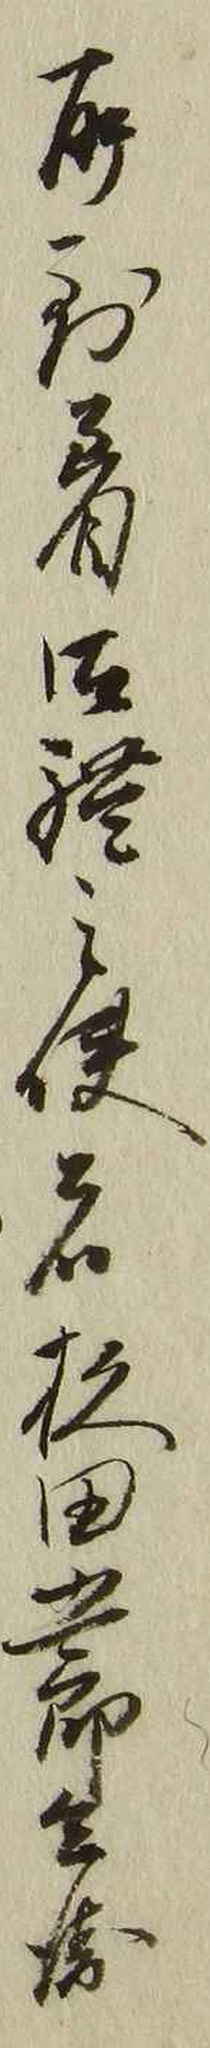所到着御礼之使者杉田五郎兵衛
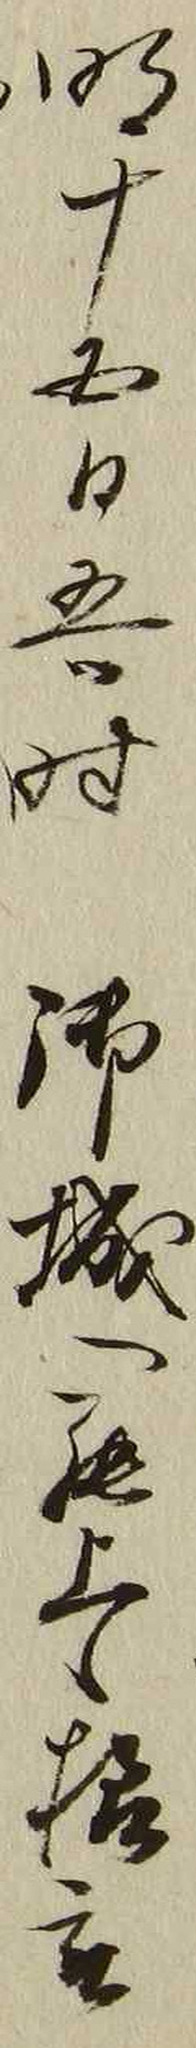明十五日五ツ時御城へ罷上候様被
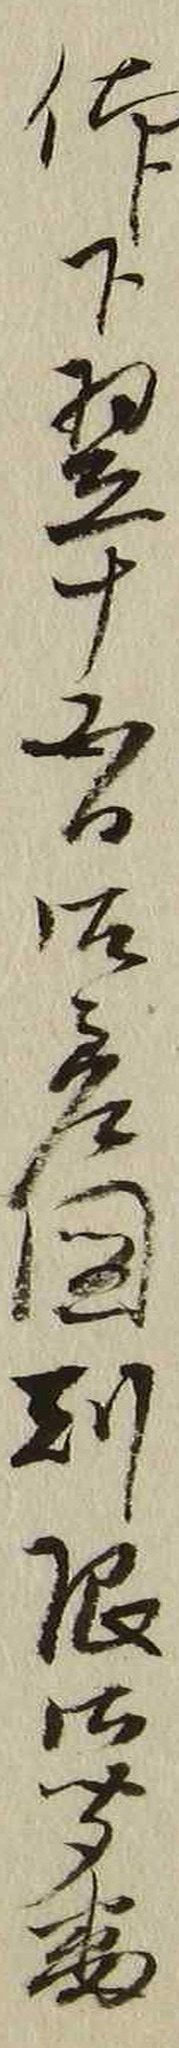仰下翌十五日御差図刻限御聞番
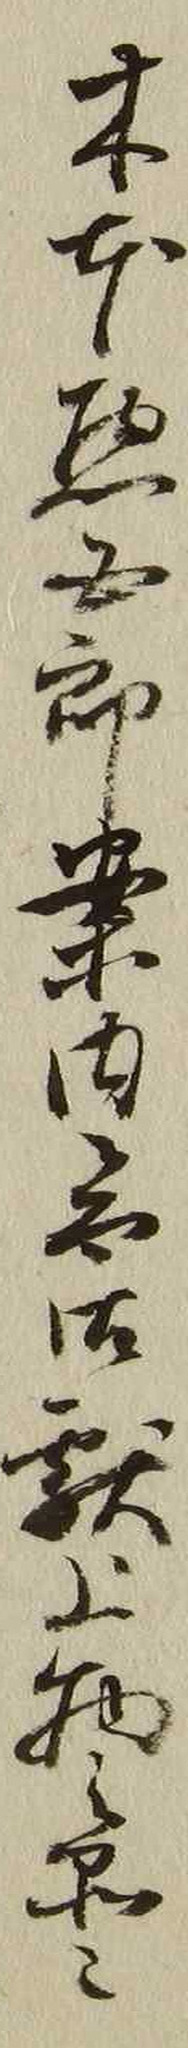木本惣五郎案内ニ而御献上物之品々
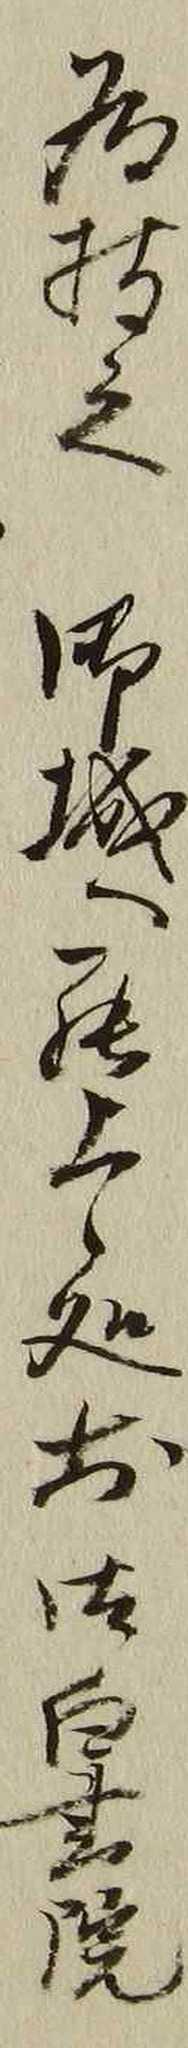為持之御城へ罷上候処於御白書院
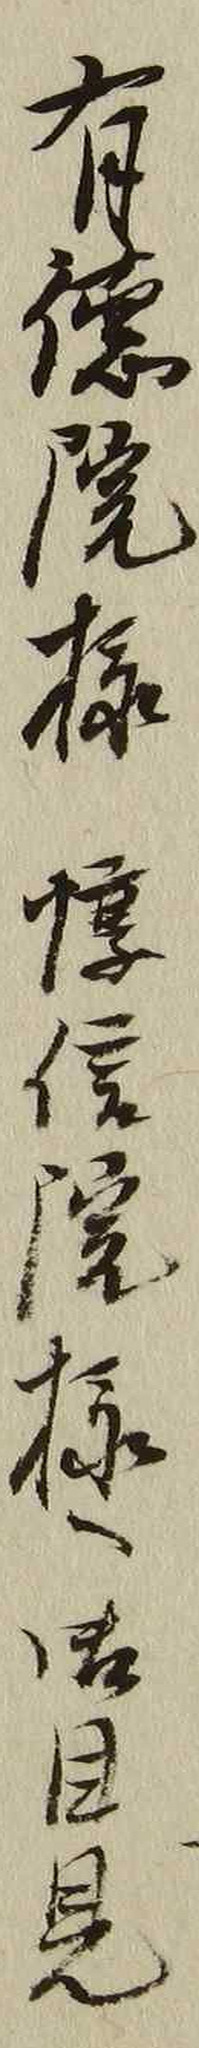有徳院様惇信院様へ御目見
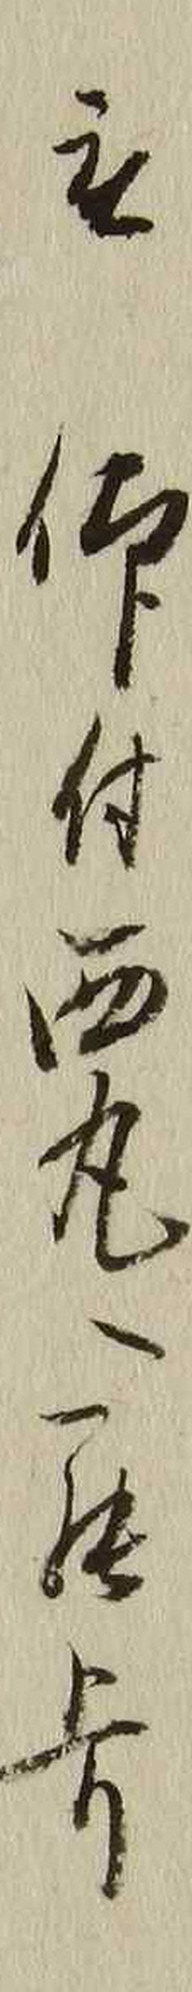被仰付西丸へ罷上り
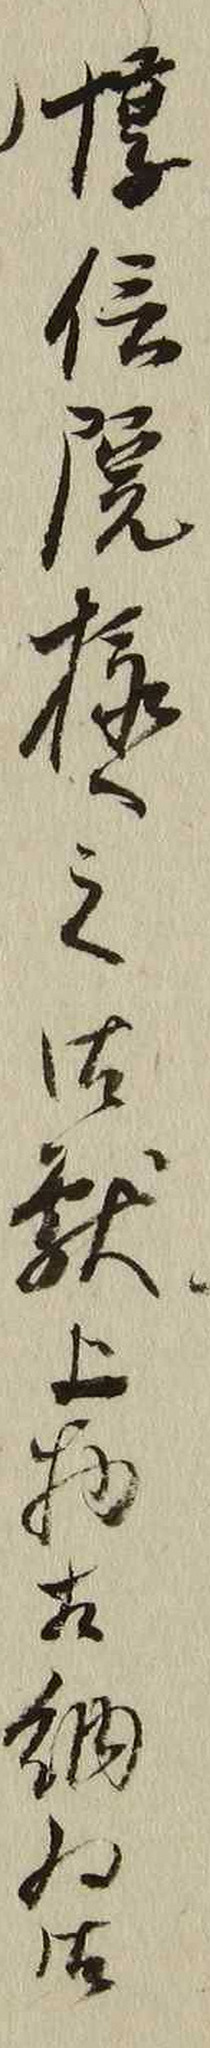惇信院様へ之御献上物相納為御
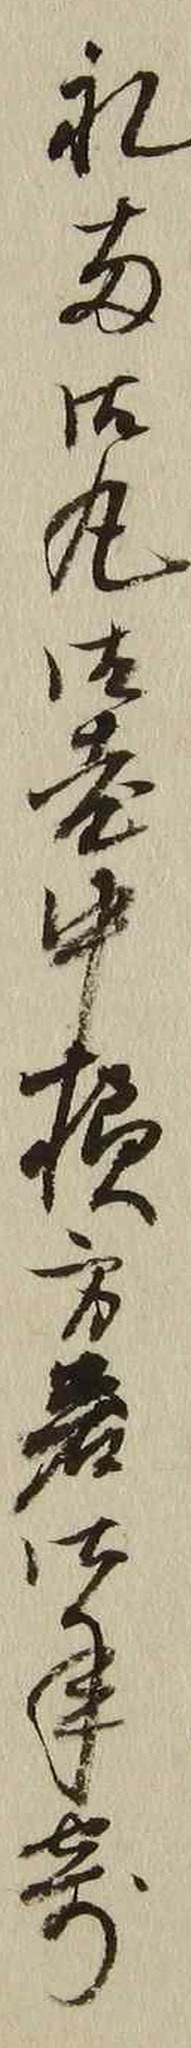礼両御丸御老中様方若御年寄
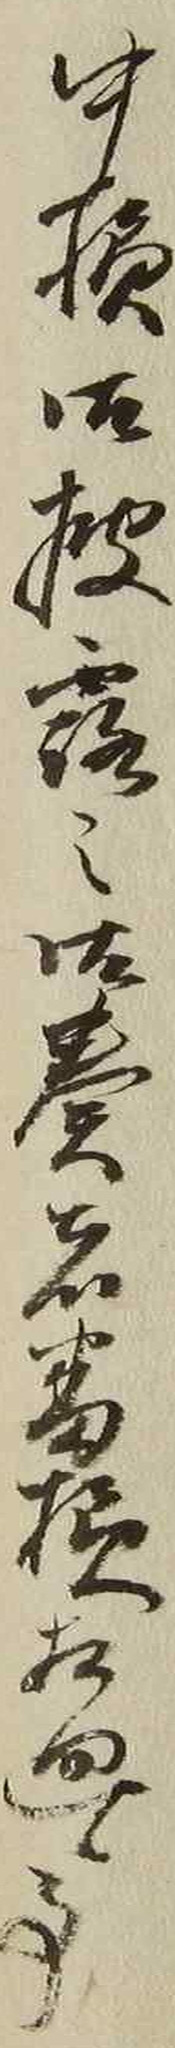中様御披露之御奏者番様相廻候事
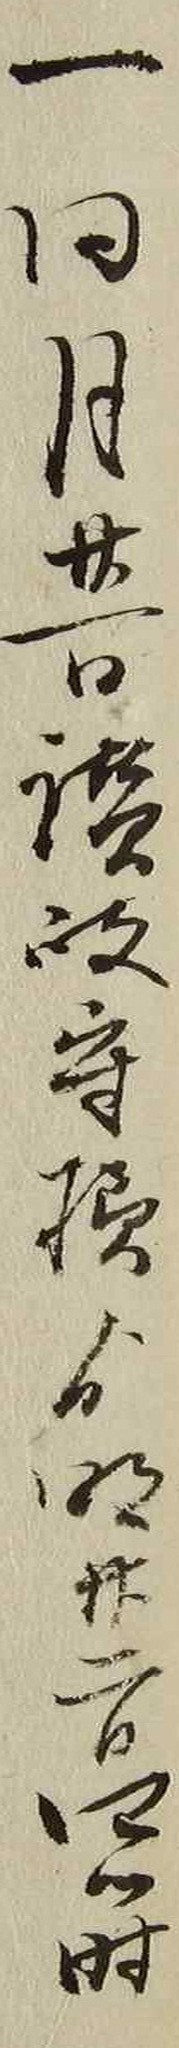一同月廿一日讃岐守様ゟ明廿二日四ツ時
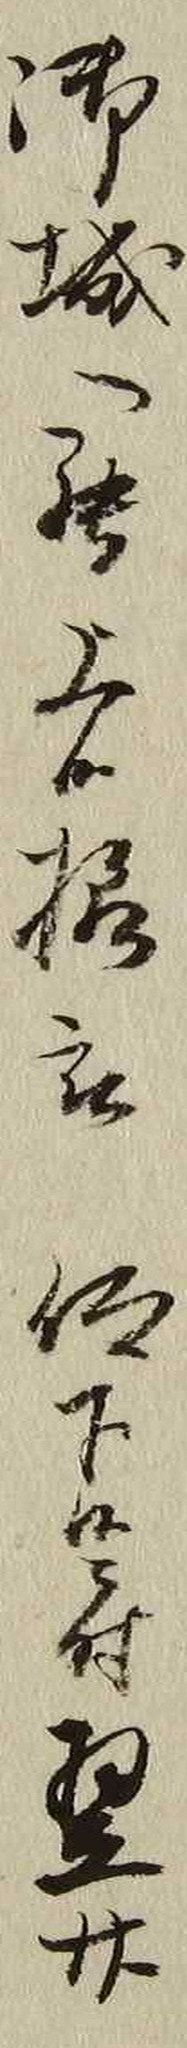御城へ罷上候様被仰下候ニ付翌廿
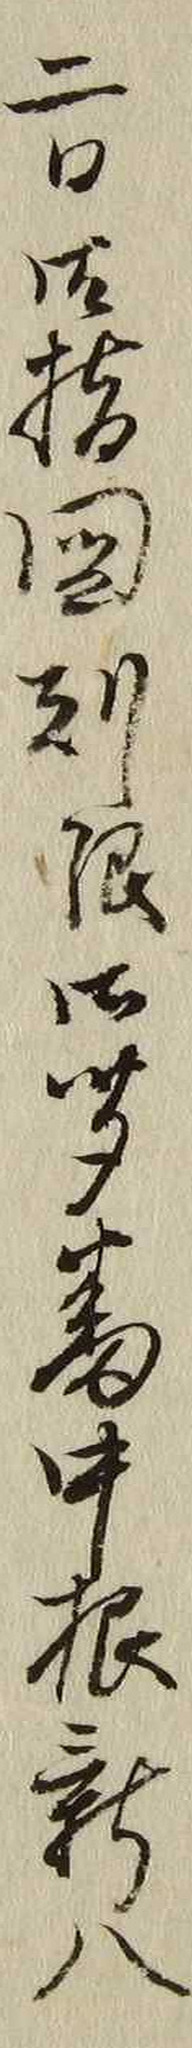二日御指図刻限御聞番中根新八
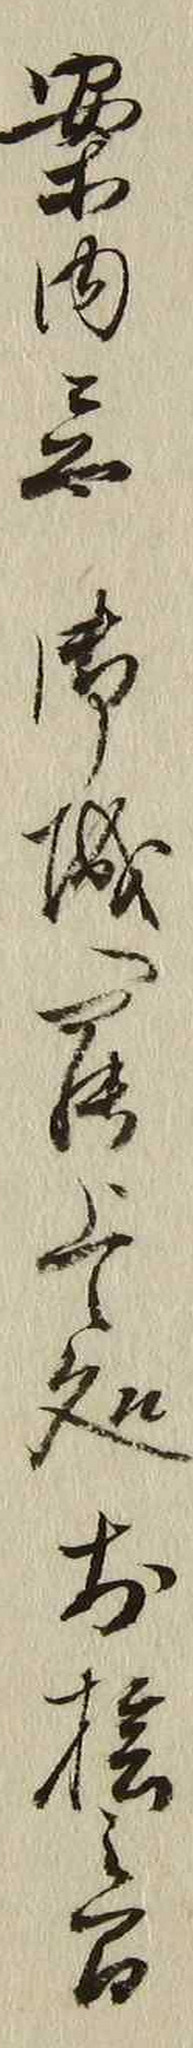案内ニ而御城へ罷上候処於桧之間
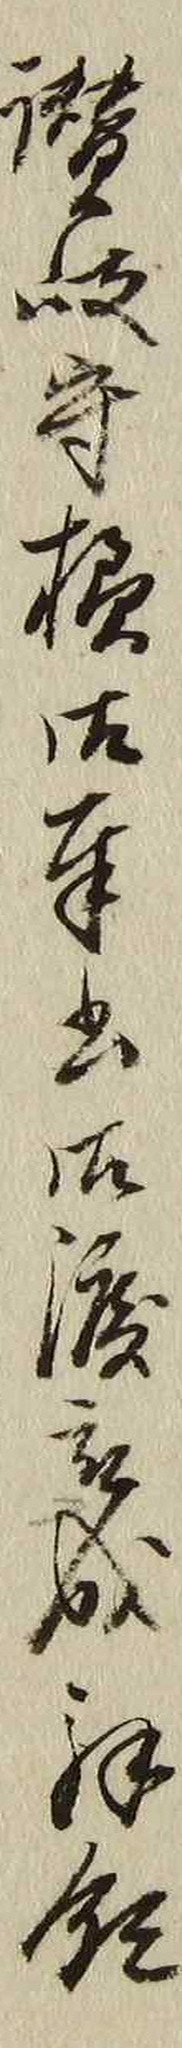讃岐守様御奉書御渡被成拝領
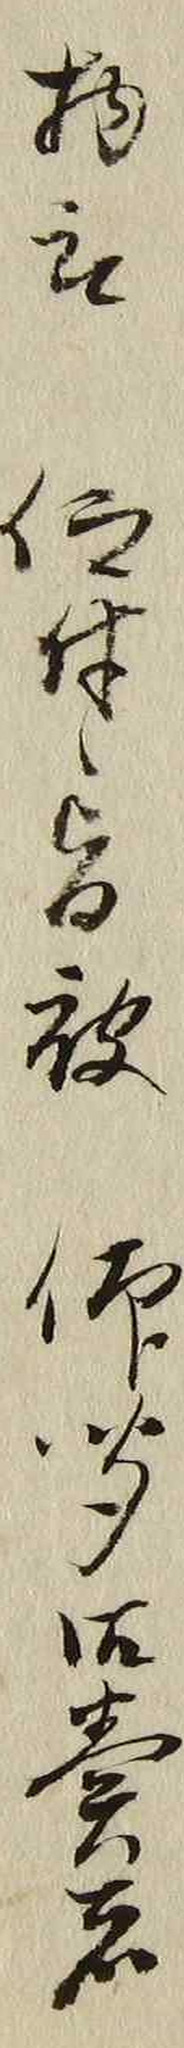物被仰付之旨被仰聞御奏者
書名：諸士系譜　巻之351　す之部1
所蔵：会津若松市立会津図書館
